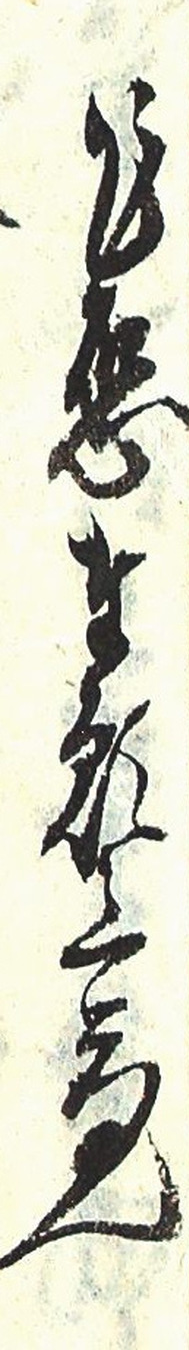乍恐奉願上覚
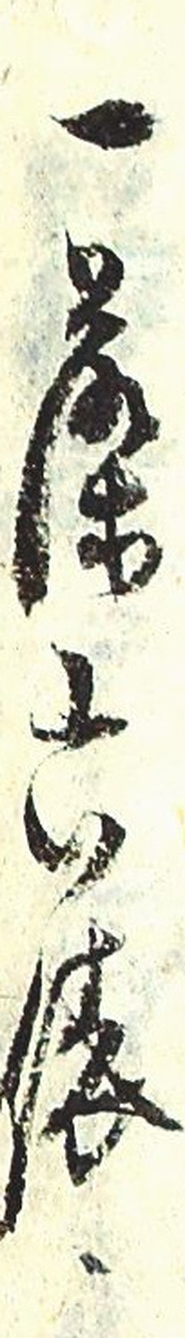一蒅六俵
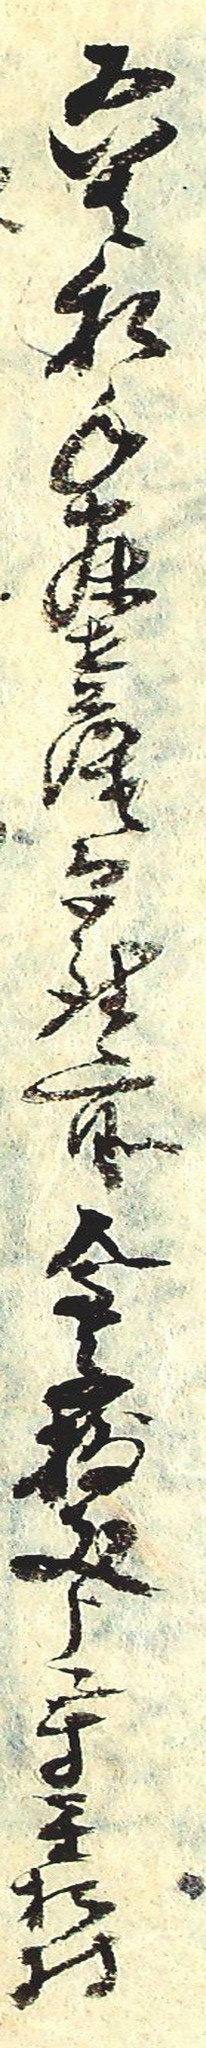右は私手寐せ蒅にて御座候所金子指支申に付重松村
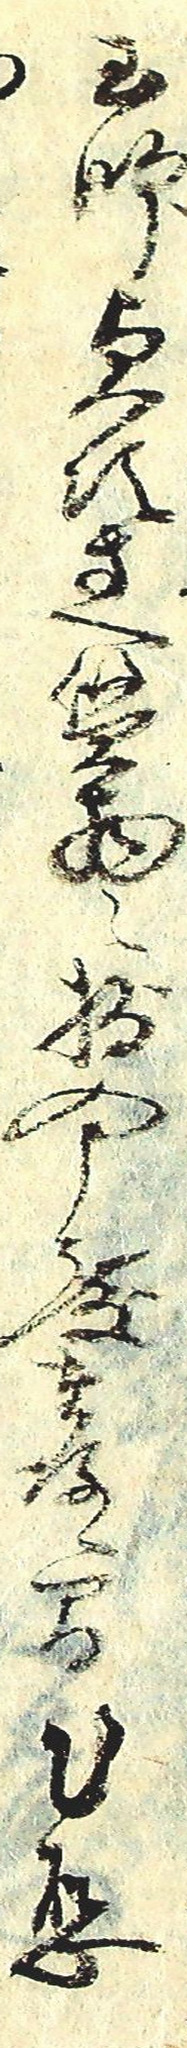玉師貞次方へ質物に指入申度奉存候間乍恐
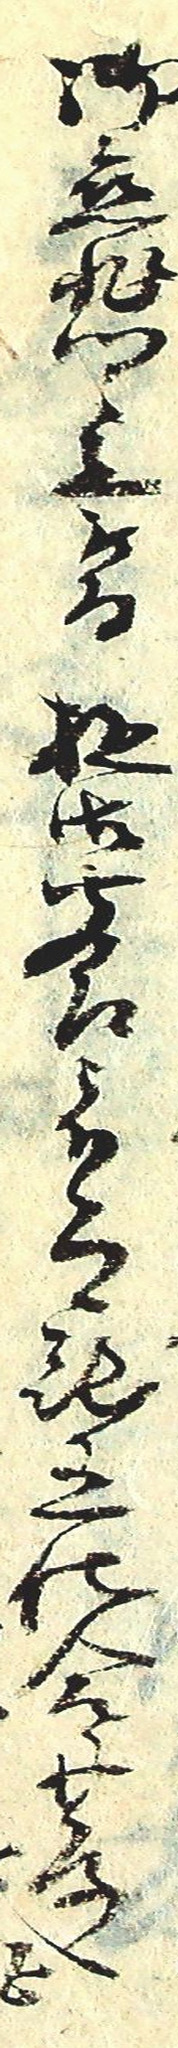御慈悲之上被為遊御聞召被下候はゝ難有仕合に奉存候以上
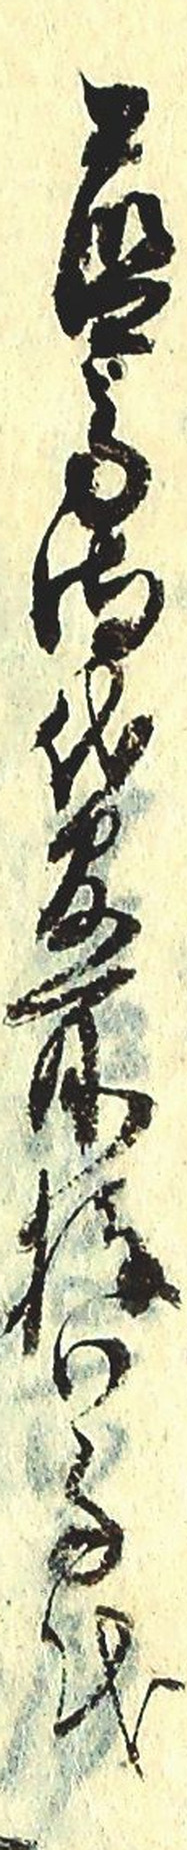藍方御代官所様御手代
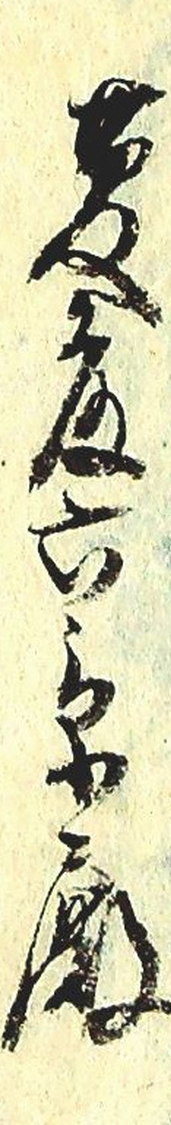菅藤六兵衛殿
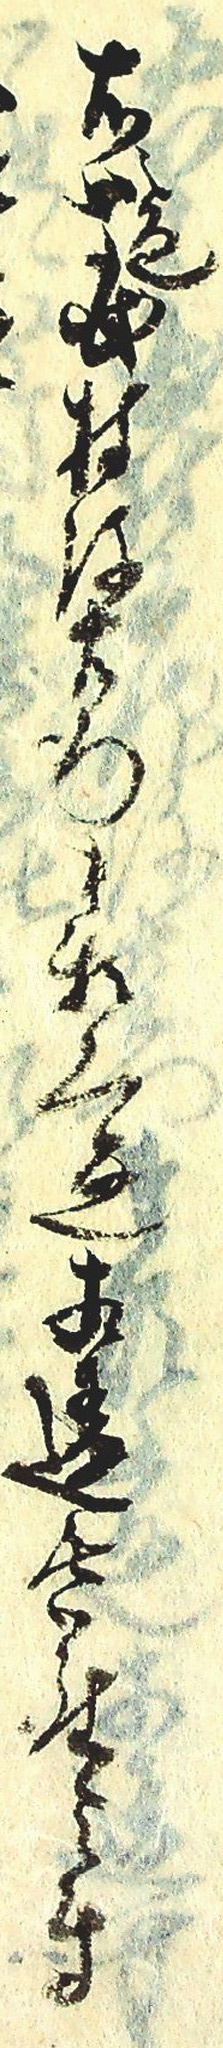右之通当村弥右衛門奉願上通相違無御座候に付
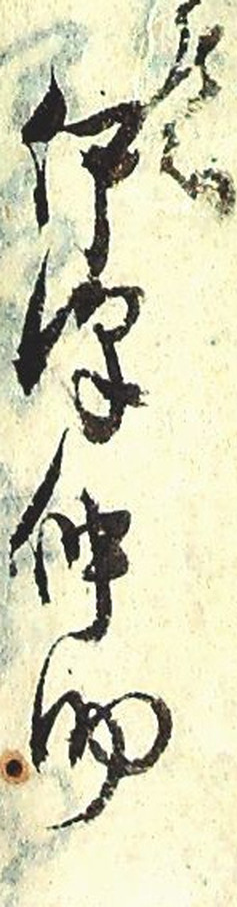伊沢仲助
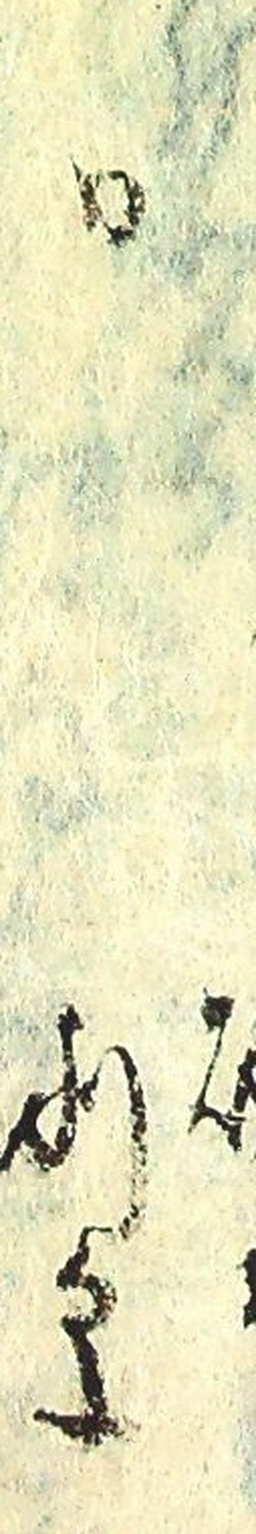同利兵衛
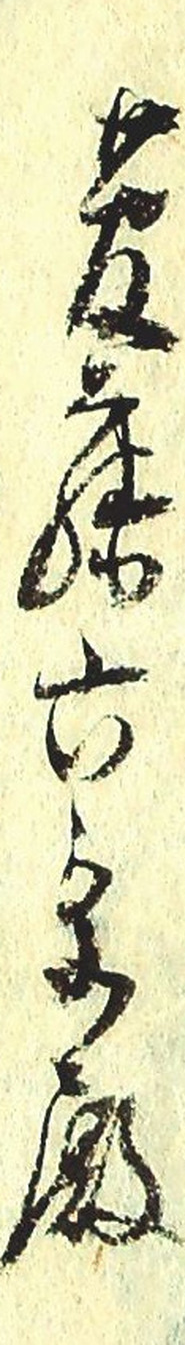菅藤六兵衛殿
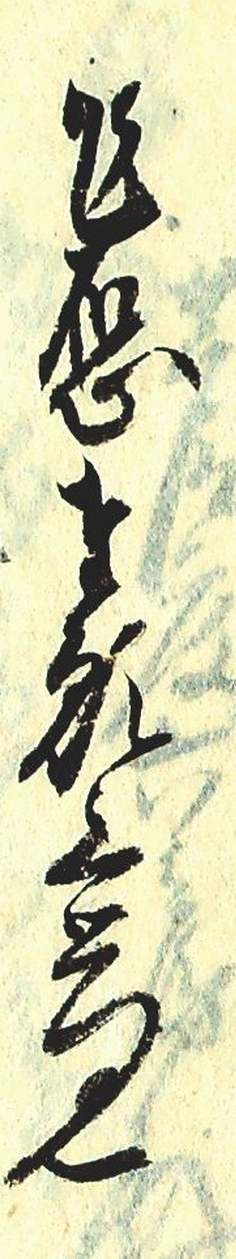乍恐奉願上覚
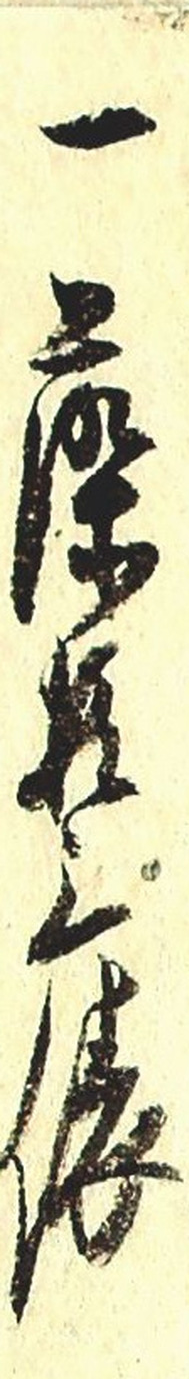一蒅拾三俵
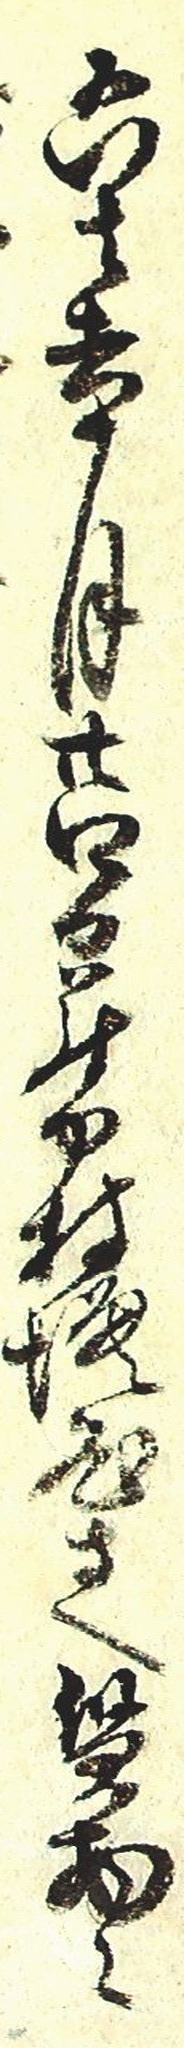右は去十月廿四日府中村増屋方へ質物に
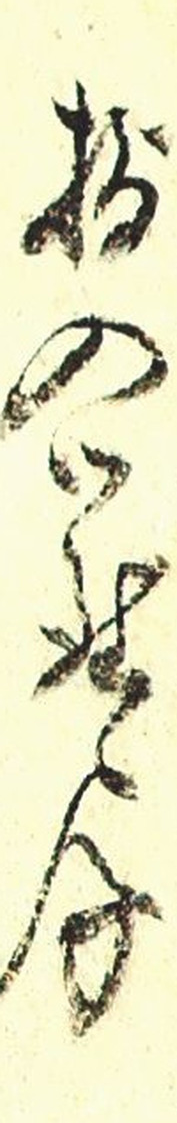指入御座候分
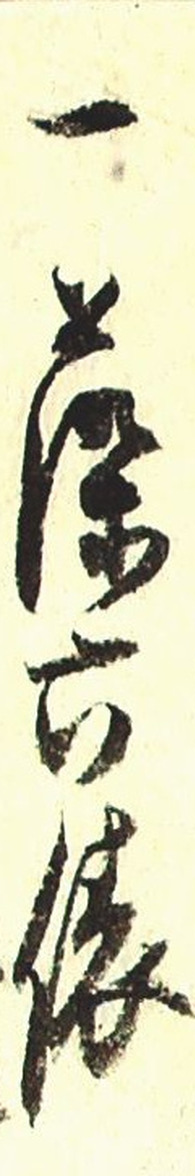一蒅六俵
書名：諸御願書控(弐番）
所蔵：鳴門教育大学 Naruto University of Education
